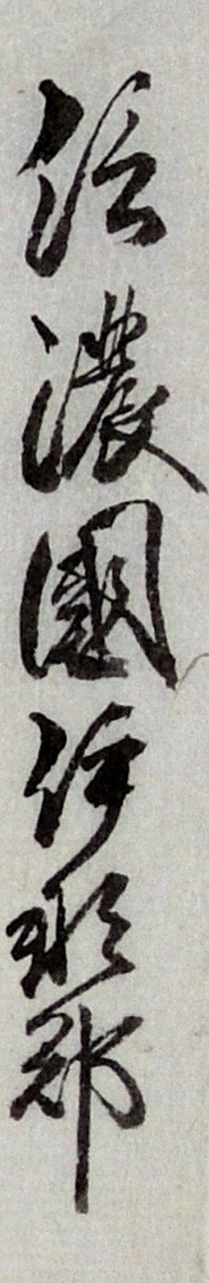信濃国伊那郡
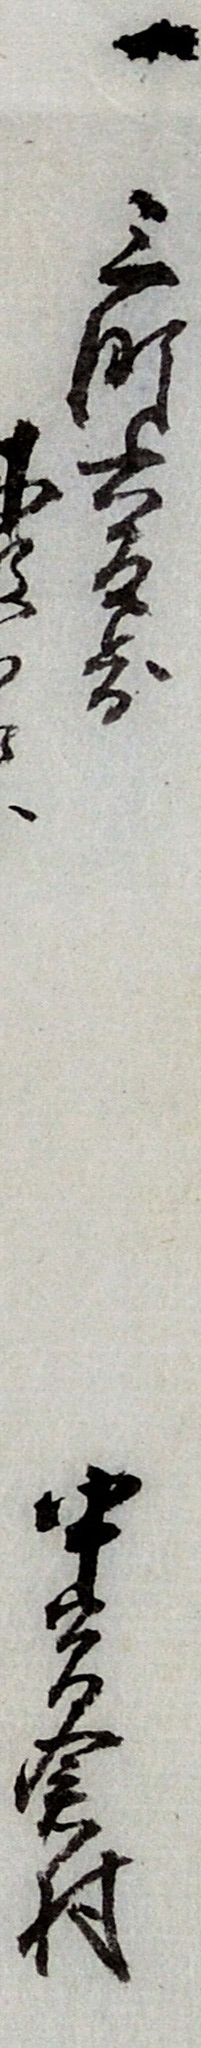一三町六反歩中曽倉村
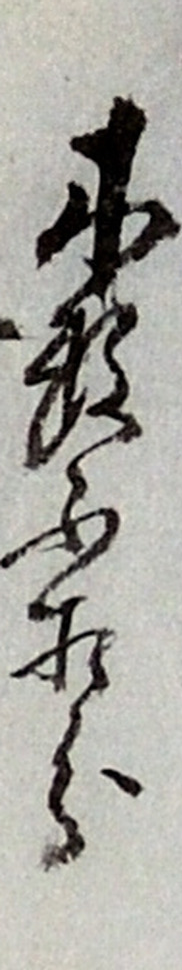木数不相分
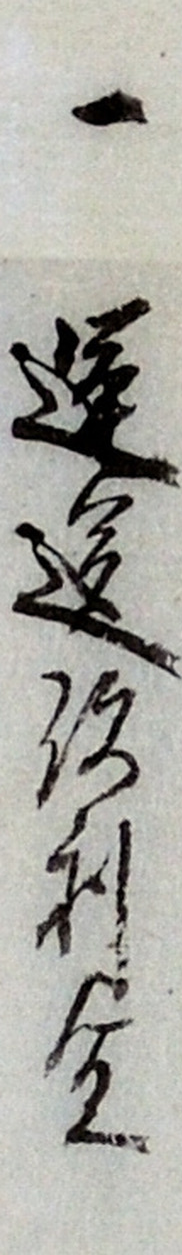一運送便利宜
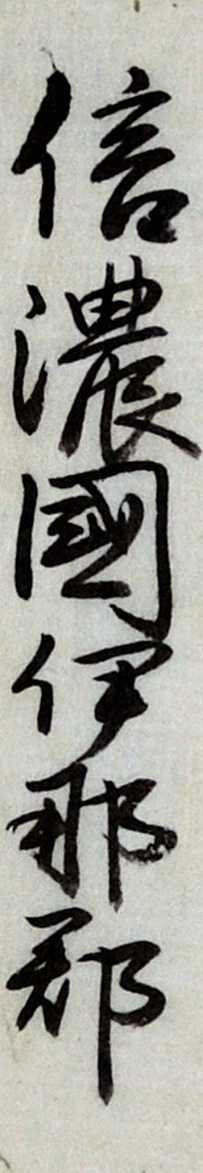信濃国伊那郡
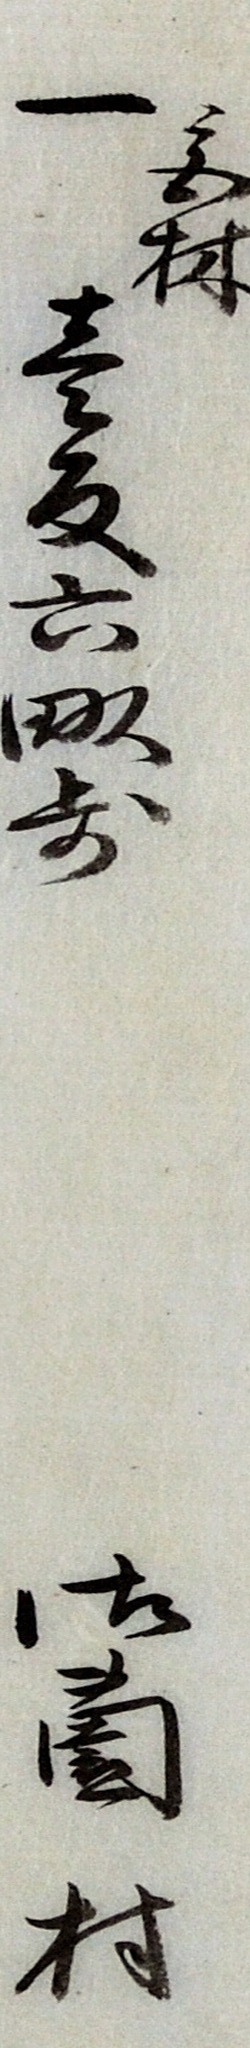一壱反六㽗歩御薗村
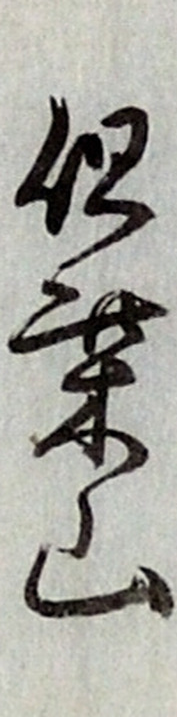但柴山
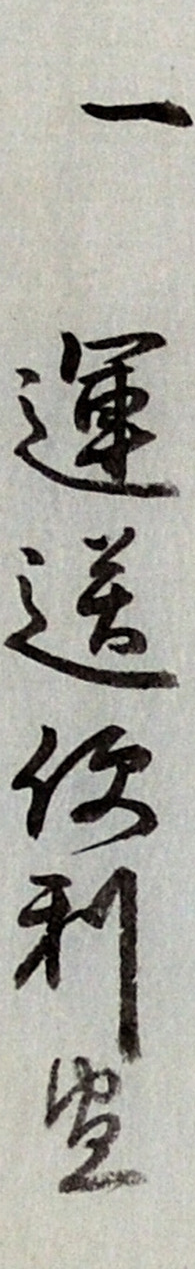一運送便利宜
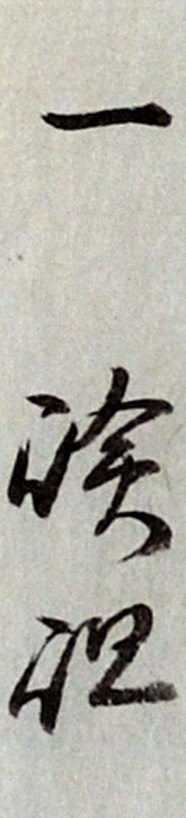一嶮岨

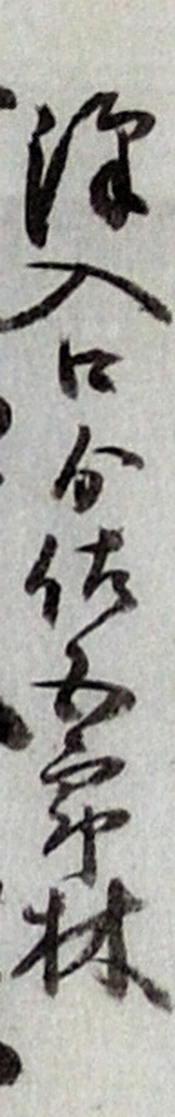澤入口ゟ佐五郎林
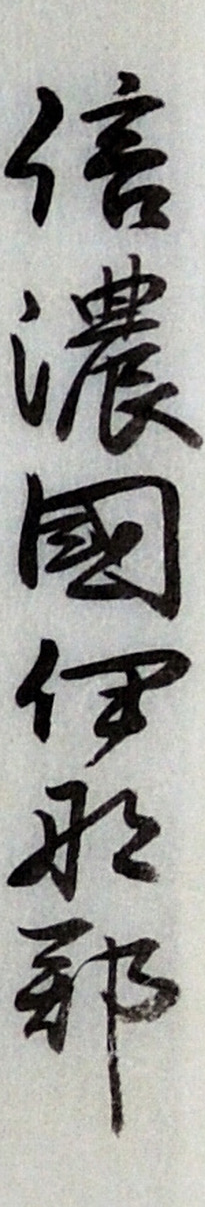信濃国伊那郡
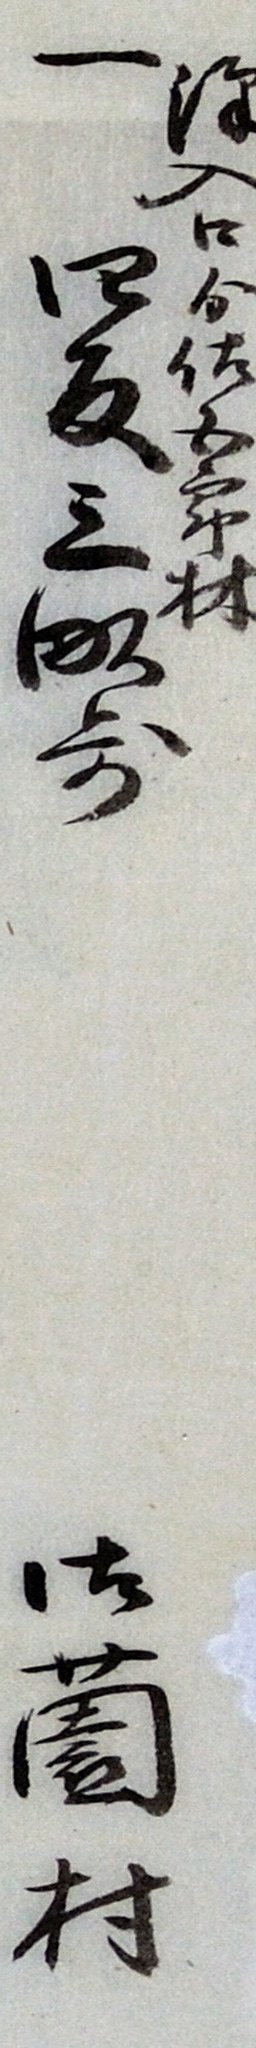一四反三㽗歩御薗村
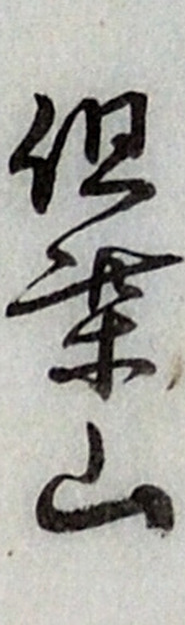但柴山
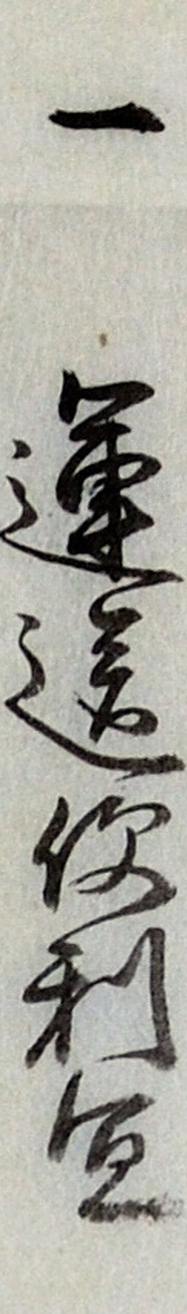一運送便利宜
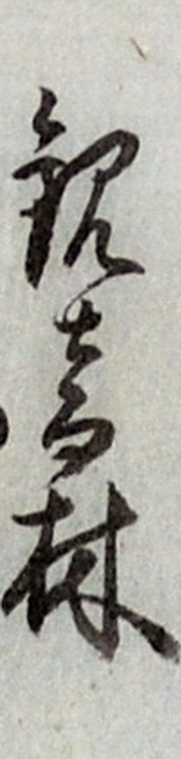観音林
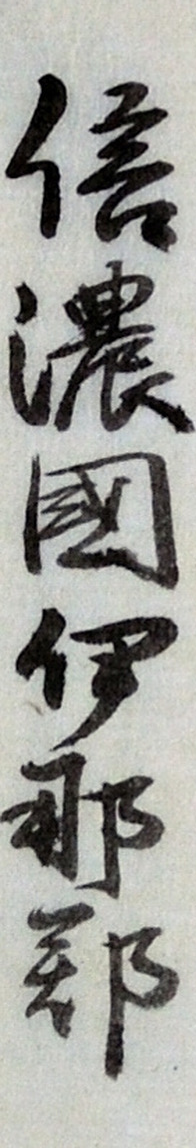信濃国伊那郡
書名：官林反別帳
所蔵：伊那市立高遠町図書館・合同会社AMANE
